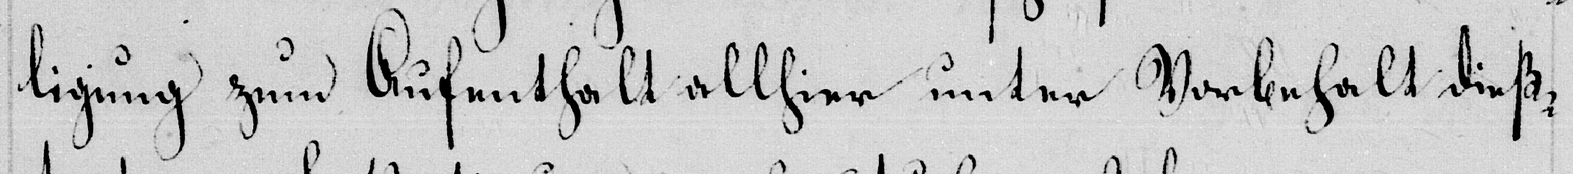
ligung zum Aufenthalt allhier unter Vorbehalt dießs¬
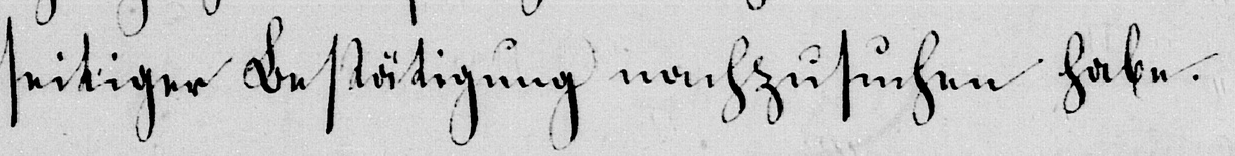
eitiger Bestätigung nachzusuchen habe.
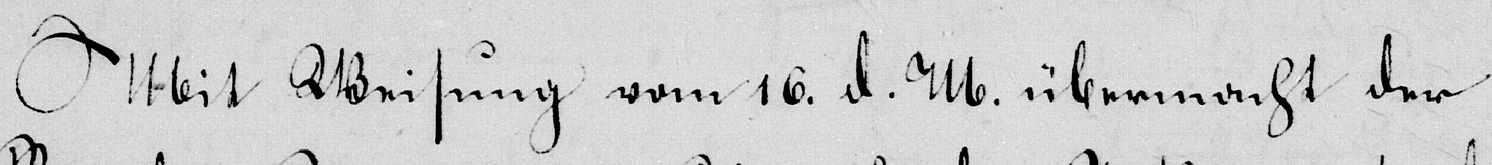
Mit Weisung vom 16. d. M. übermacht der
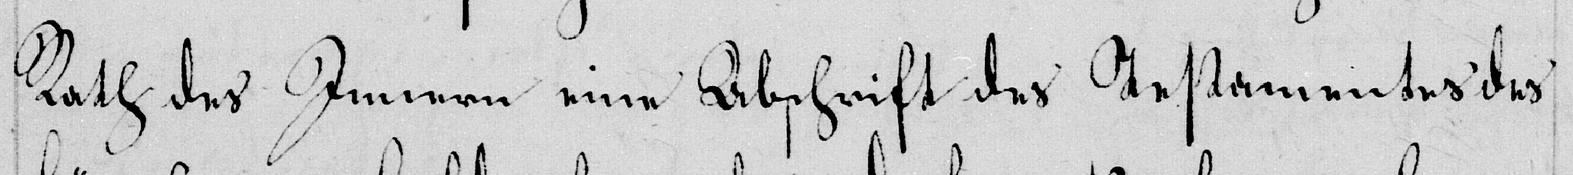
Rath des Innern eine Abschrift des Testamentes des
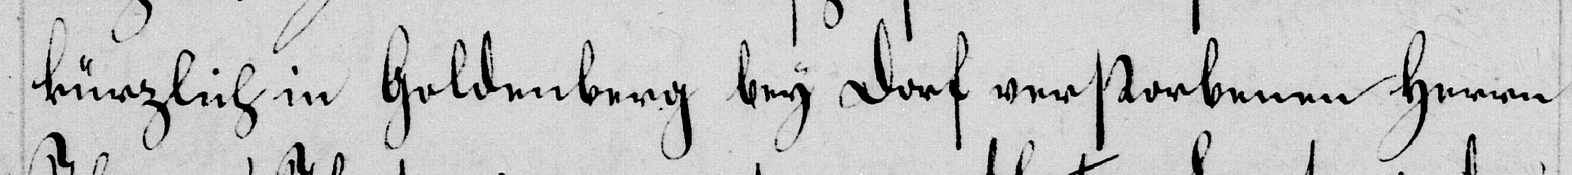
kürzlich in Goldenberg bey Dorf verstorbenen Herrn
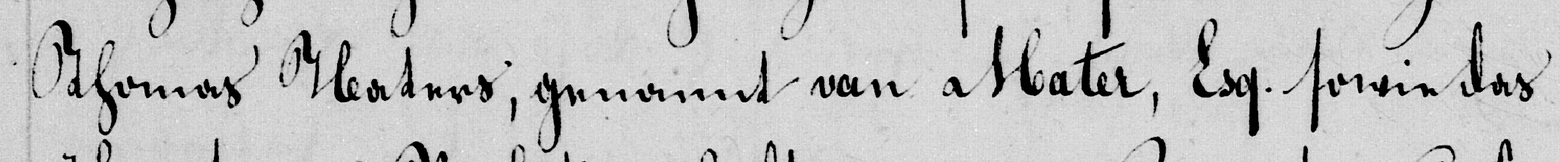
Thomas Naters, genannt van Mater, Esq. sowie das
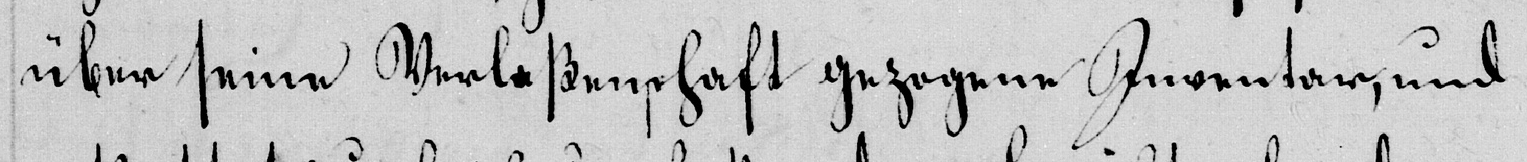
über seine Verlaßenschaft gezogene Inventar, und
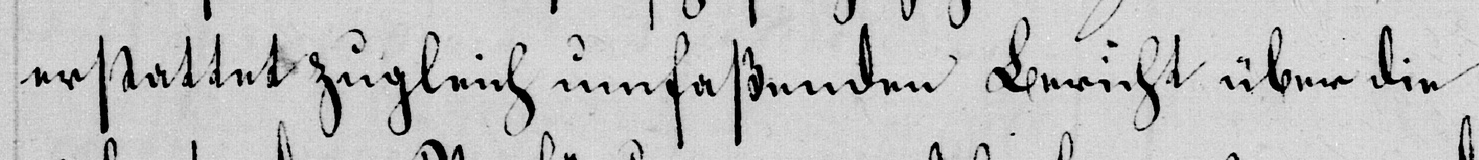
erstattet zugleich umfaßenden Bericht über die
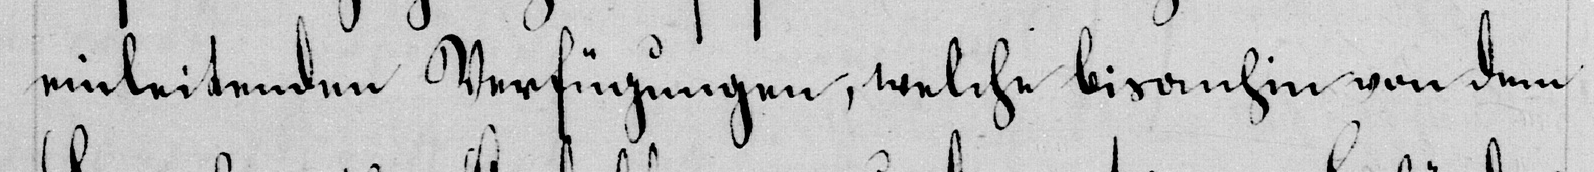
einleitenden Verfügungen, welche bis anhin von dem
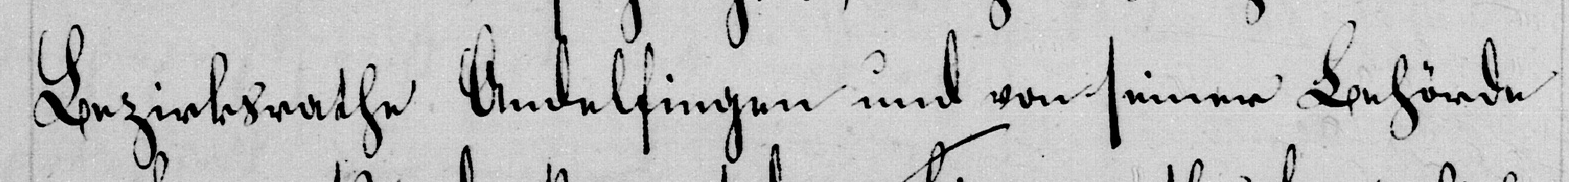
Bezirksrath Andelfingen und von seiner Behörde
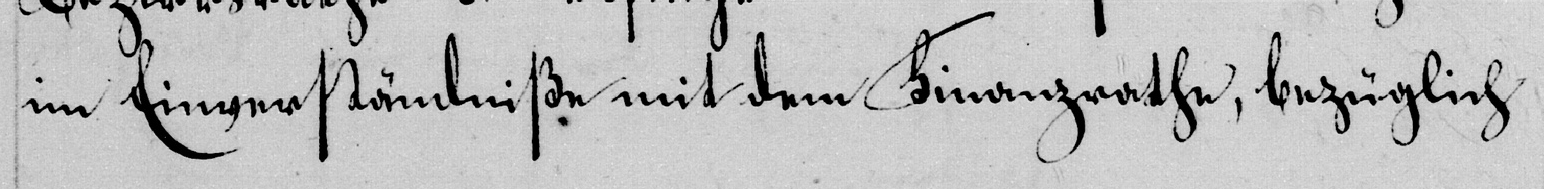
im Einverständniße mit dem Finanzrathe, bezüglich
